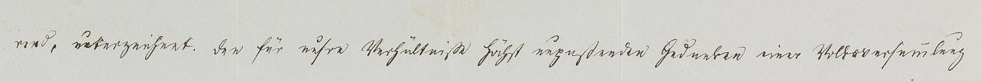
rend, unterzeichnet. Den für unsre Verhältnisse höchst unpassenden Gedanken einer Volksversammlung
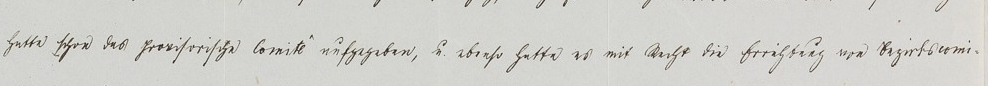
hatte schon das provisorische Comité aufgegeben, u. ebenso hatte es mit Recht die Errichtung von Bezirkscomi-
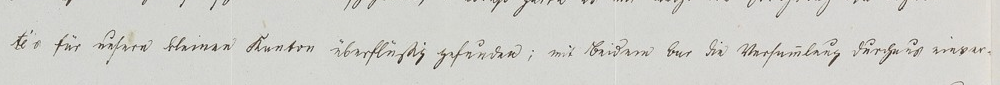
tés für unsern kleinen Kanton überflüssig gefunden; mit Beidem war die Versammlung durchaus einver-
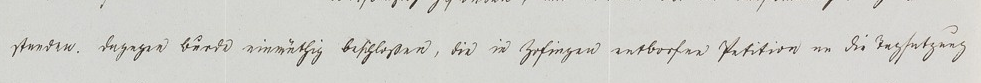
standen. Dagegen wurde einmüthig beschlossen, die in Zofingen entworfne Petition an die Tagsatzung
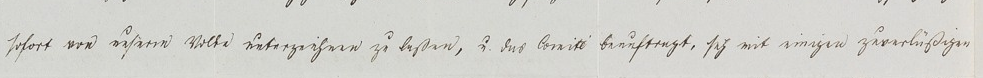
sofort von unserm Volke unterzeichnen zu lassen, u. das Comité beauftragt, sich mit einigen zuverläßigen
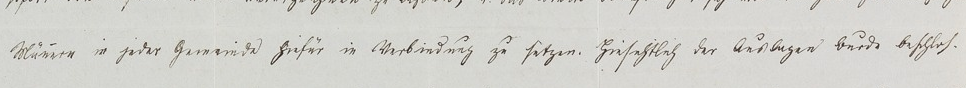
Männern in jeder Gemeinde hiefür in Verbindung zu setzen. Hinsichtlich der Auslagen wurde beschlos-
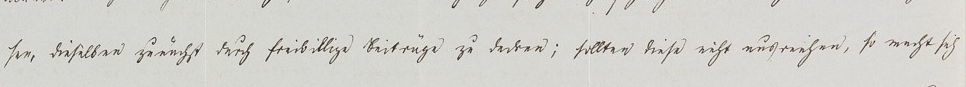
sen, dieselben zunächst durch freiwillige Beiträge zu decken; sollten diese nicht ausreichen, so macht sich
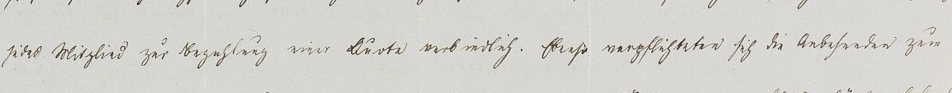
jedes Mitglied zur Bezahlung einer Quote verbindlich. Ebenso verpflichteten sich die Anwesenden zum
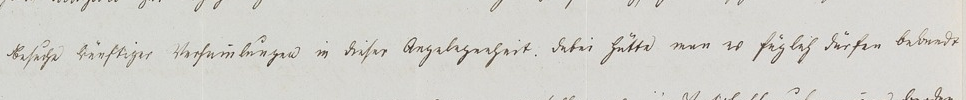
Besuche künftiger Versammlungen in dieser Angelegenheit. Dabei hätte man es füglich dürfen bewendt
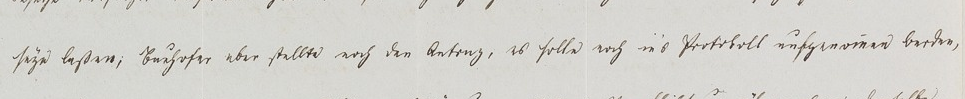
seyn lassen; Bauhofer aber stellte noch den Antrag, es solle noch in's Protokoll aufgenommen werden,
